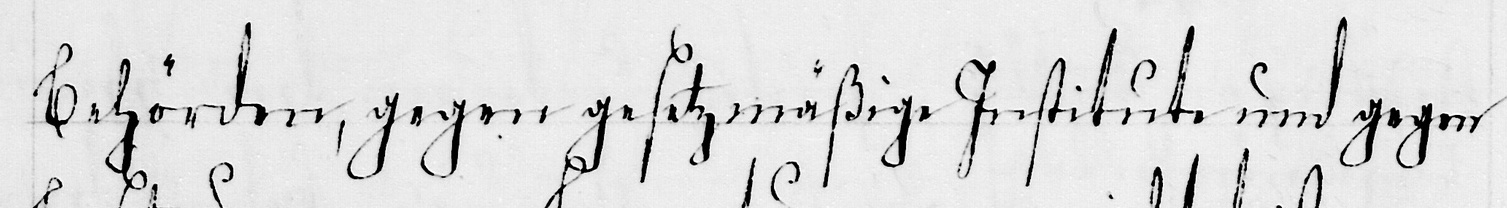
Behörden, gegen gesetzmäßige Institute und gegen
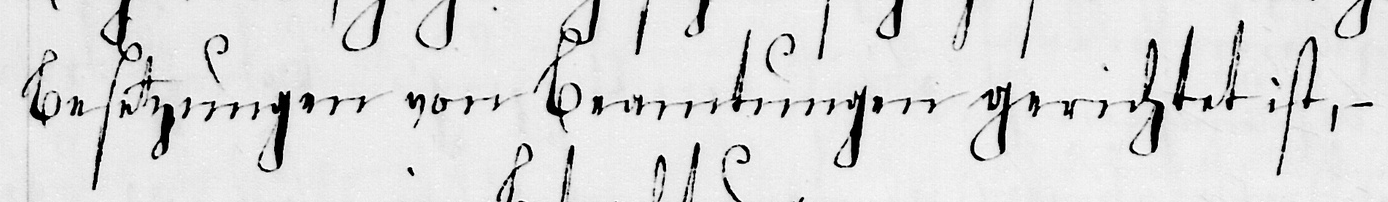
Besetzungen von Beamtungen gerichtet ist, –
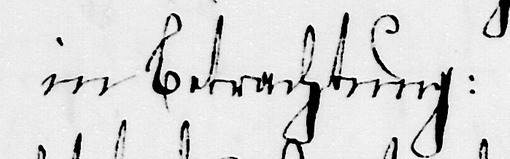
in Betrachtung:
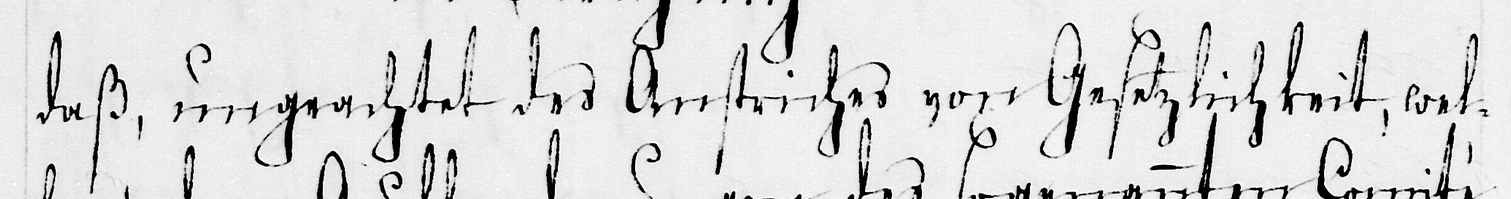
daß, ungeachtet des Anstriches von Gesetzlichkeit, wel¬
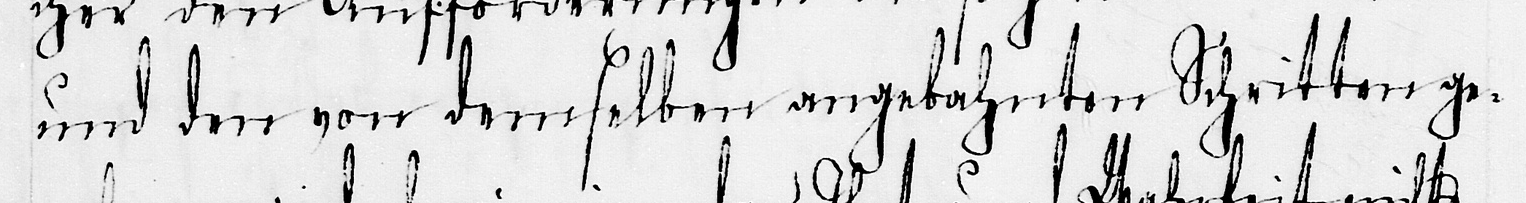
und den von demselben angebahnten Schritten ge¬
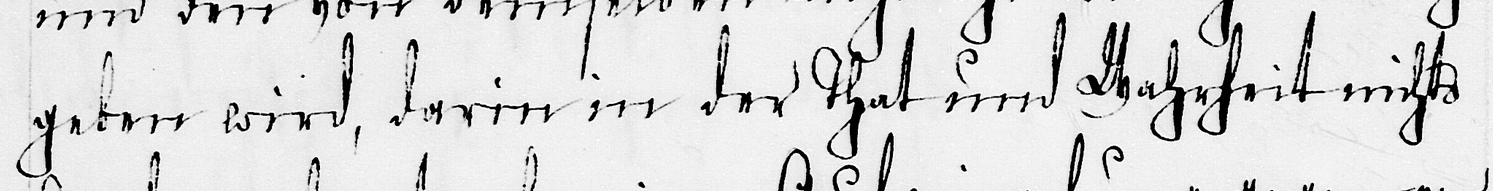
geben wird, darin in der That und Wahrheit nichts
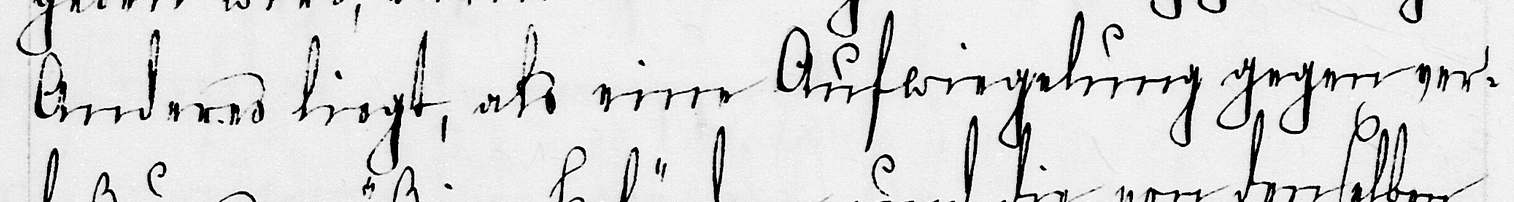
Anderes liegt, als eine Aufwiegelung gegen ver¬
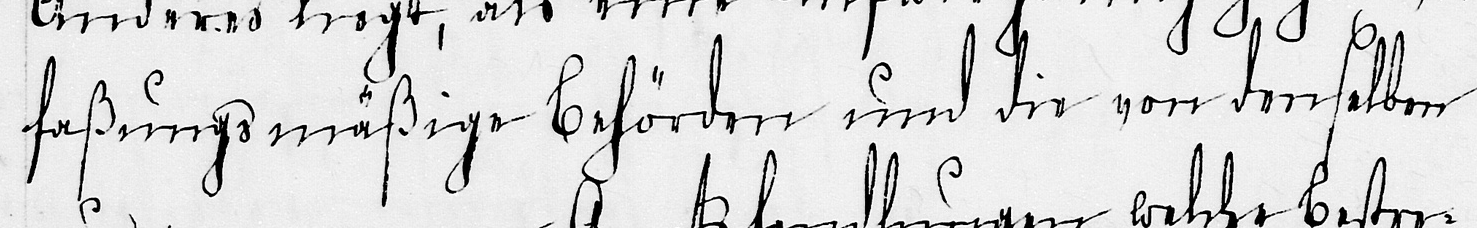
faßungsmäßige Behörden und die von denselben
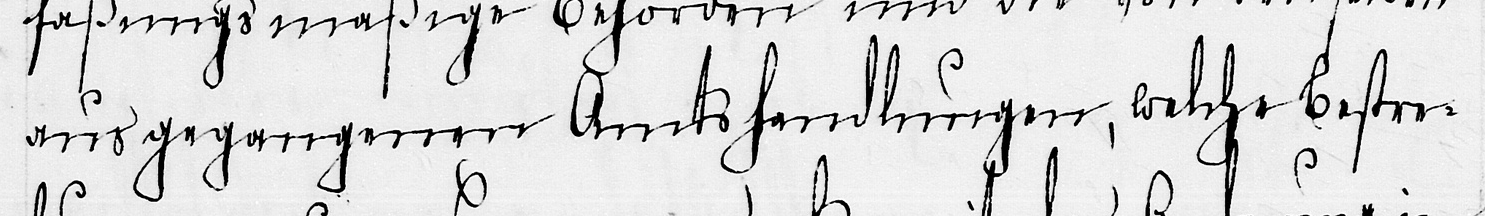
ausgegangenen Amtshandlungen, welche Bestre¬
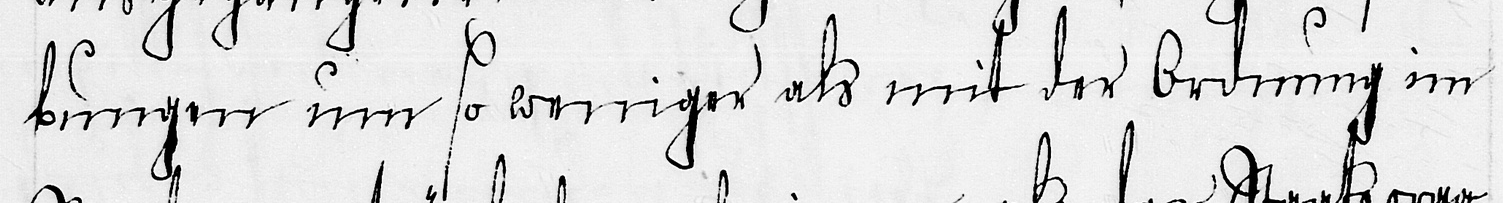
bungen um so weniger als mit der Ordnung im
